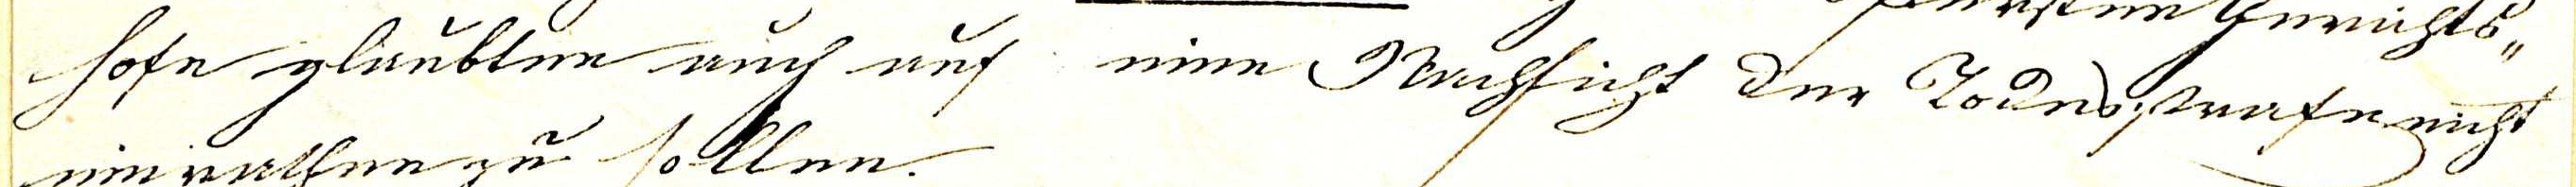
hofe glaubten auch auf eine Nachsicht der Todesstrafe nicht
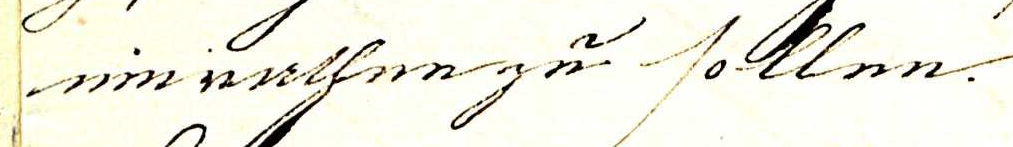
einrathen zu sollen.
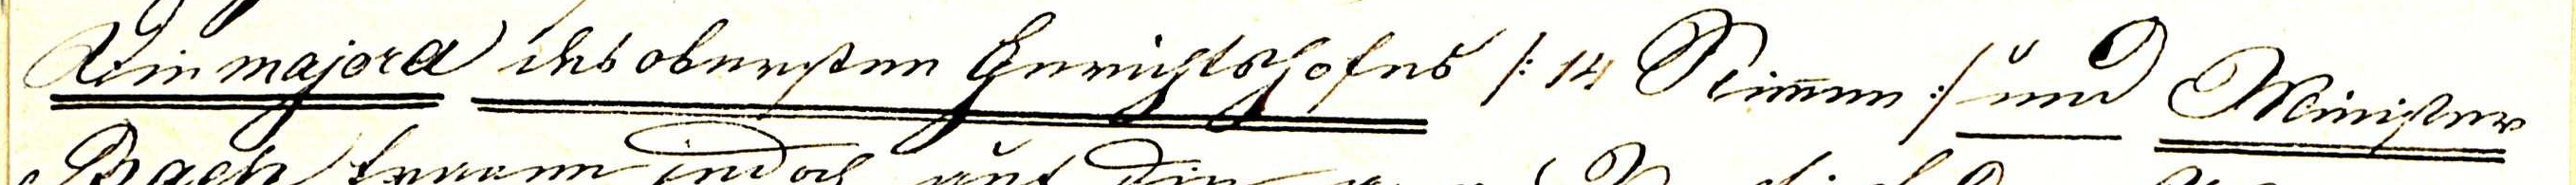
Die majora des obersten Gerichtshofes (14 Stimmen) und Minister
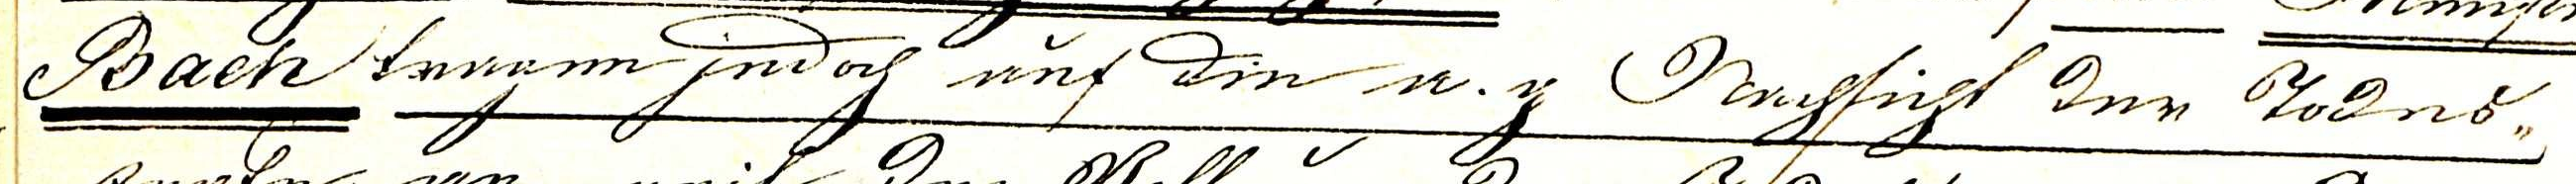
Bach tragen jedoch auf die a.g. Nachsicht der Todes¬
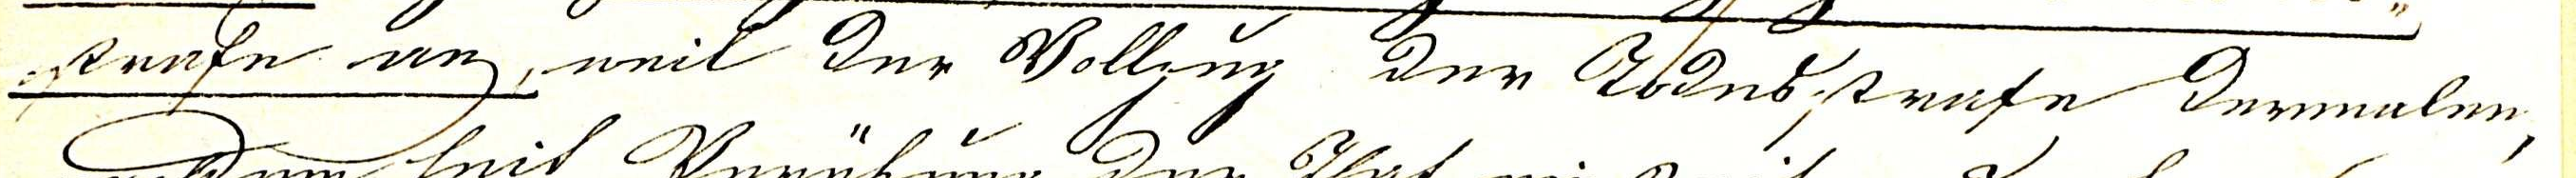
strafe an, weil der Vollzug der Todesstrafe dermalen,
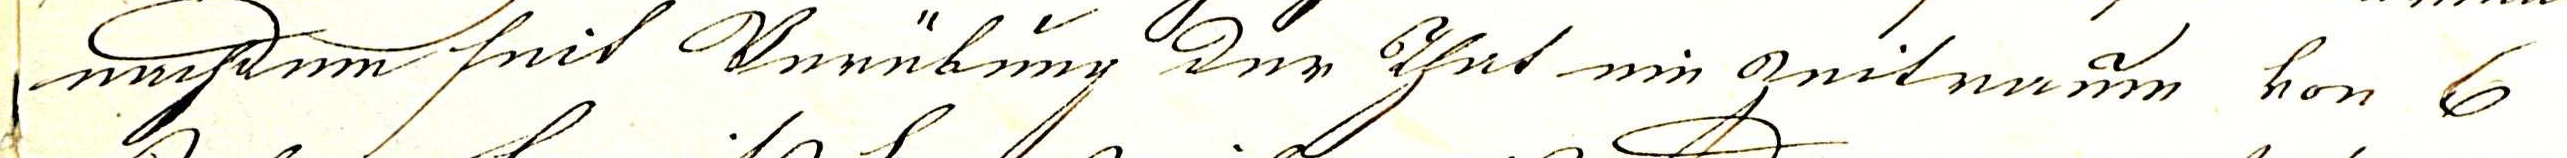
nachdem seit Verübung der That ein Zeitraum von 6
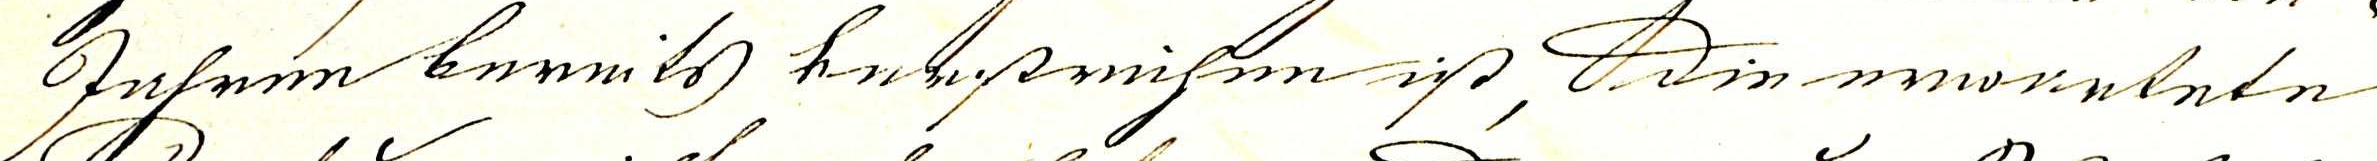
Jahren bereits verstrichen ist, die erwartete
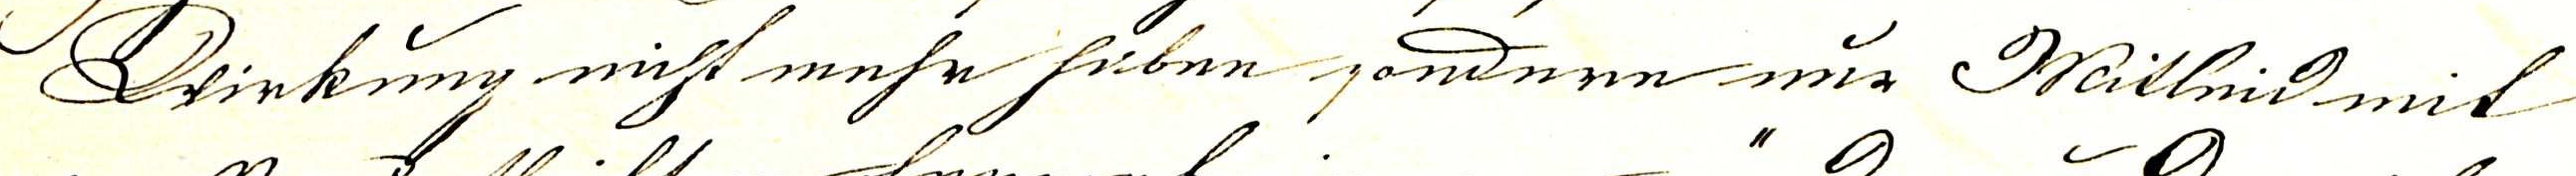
Wirkung nicht mehr haben sondern nur Mitleid mit
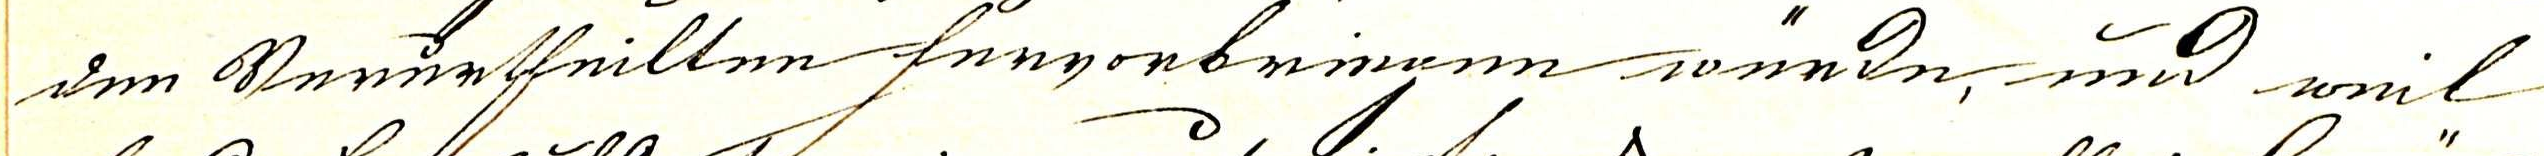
dem Verurtheilten hervorbringen würde, und weil
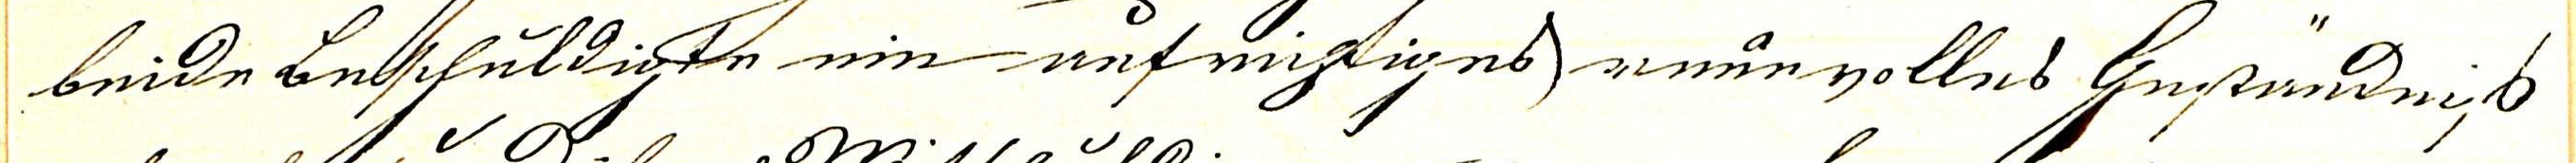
beide Beschuldigte ein aufrichtiges reuevolles Geständniß
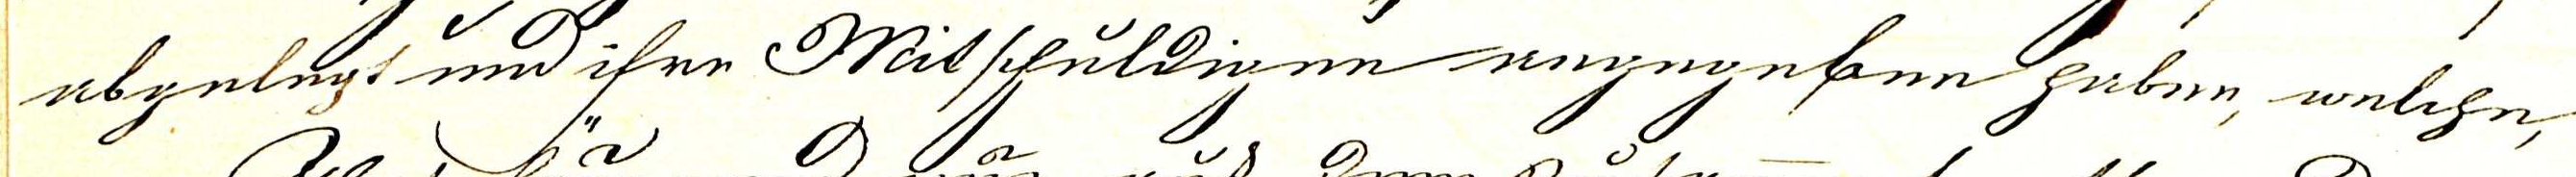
abgelegt und ihre Mitschuldigen angegeben gaben, welche,
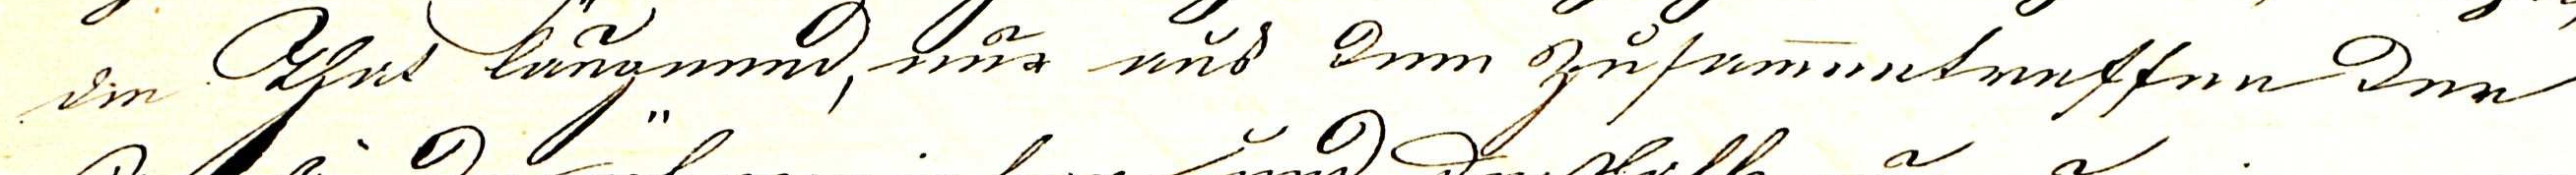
die That läugnend, nur aus dem Zusammentreffen der
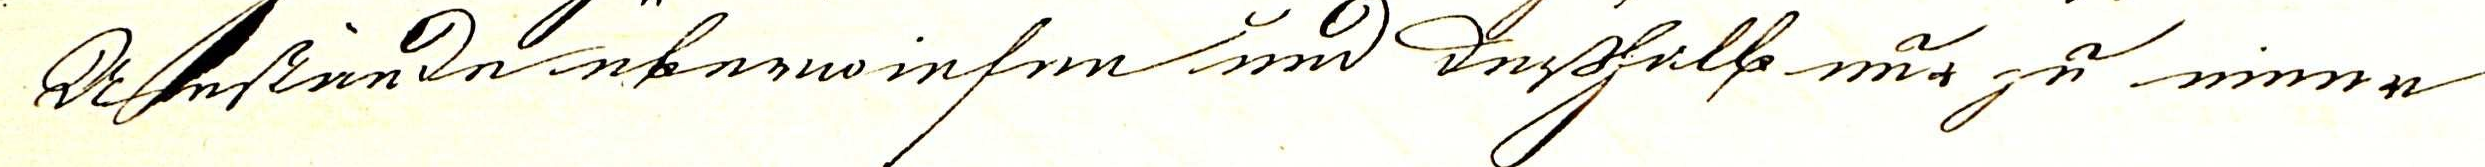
Umstände überwiesen und deßhalb nur zu einer
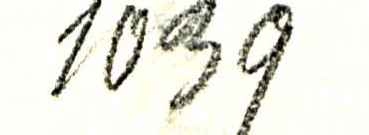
1039
